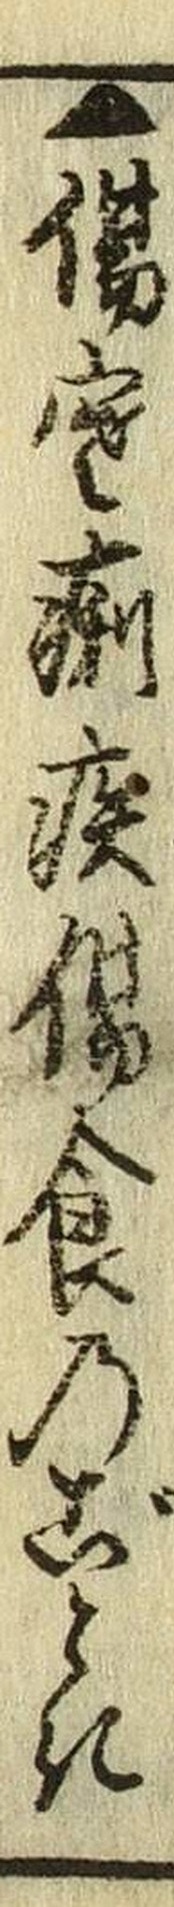▲傷寒痢疾傷食のごとき
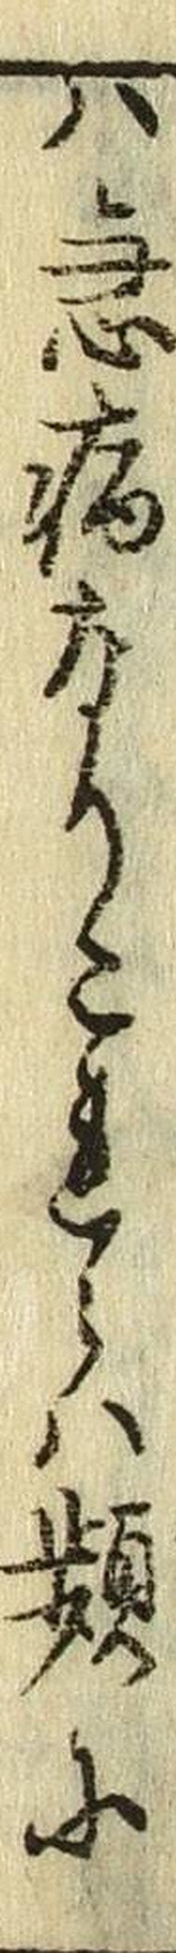は急病なりこれらは頻に
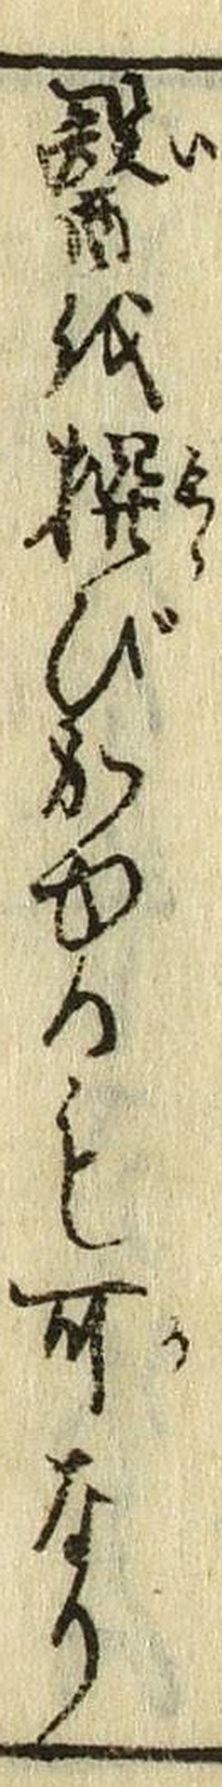医を撰びかゆるも可なり
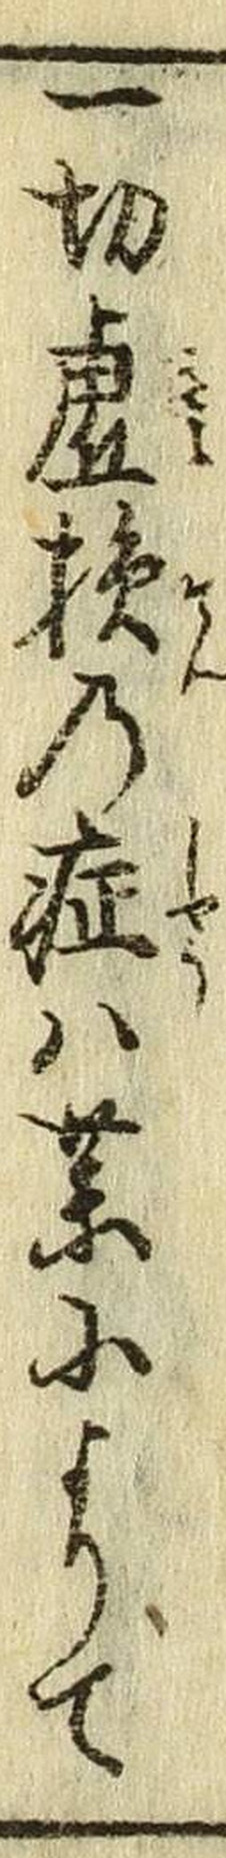一切虚損の症は薬によりて
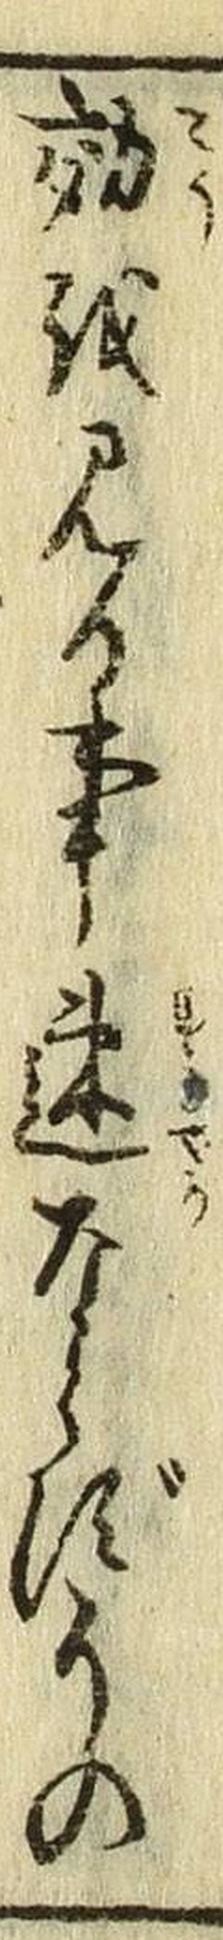効を見る事速ならずその
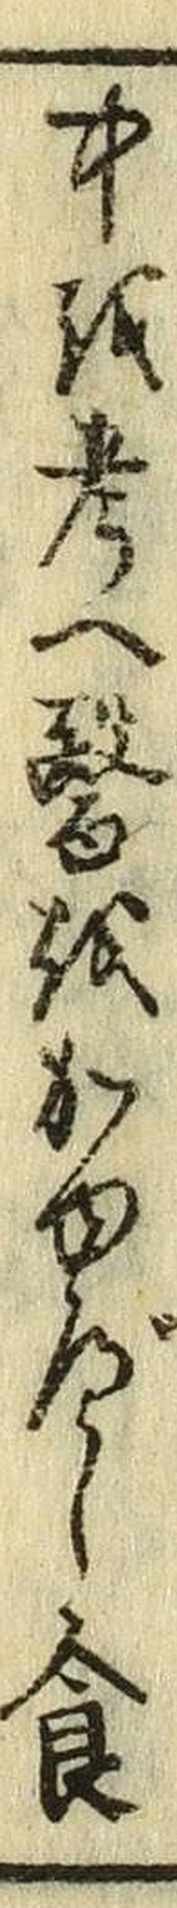中を考へ医をかゆべし食
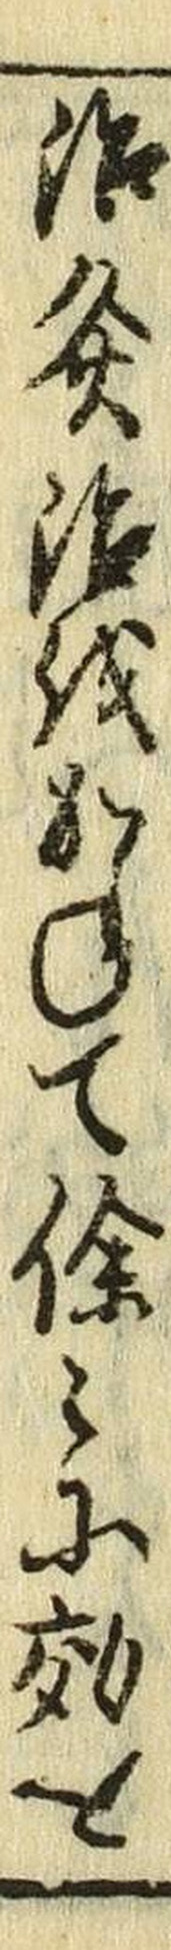治灸治をかねて徐々に効を
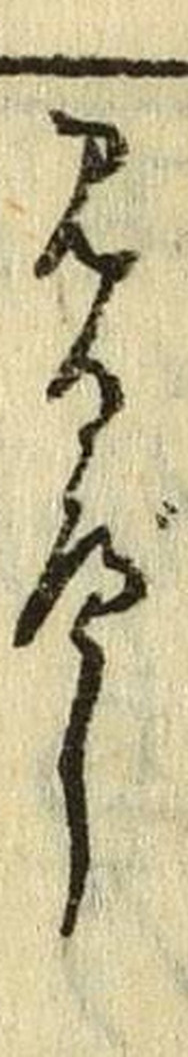見るべし
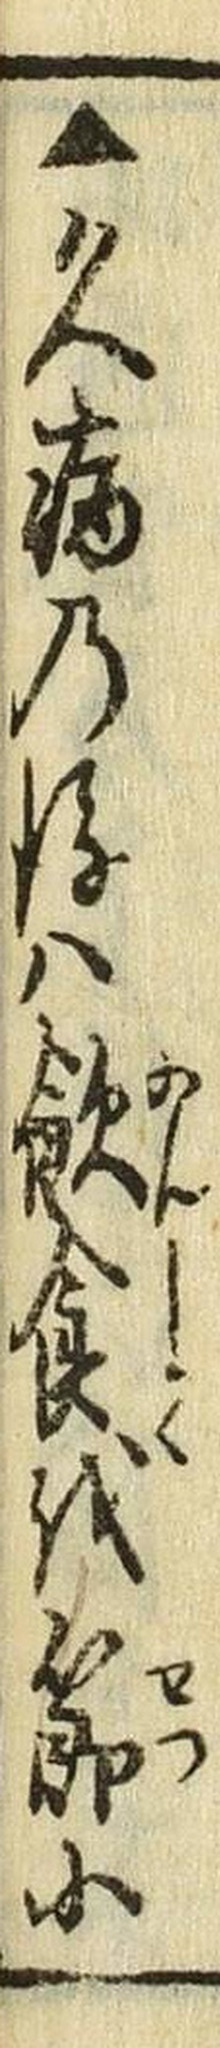▲久病の後は飲食を節に
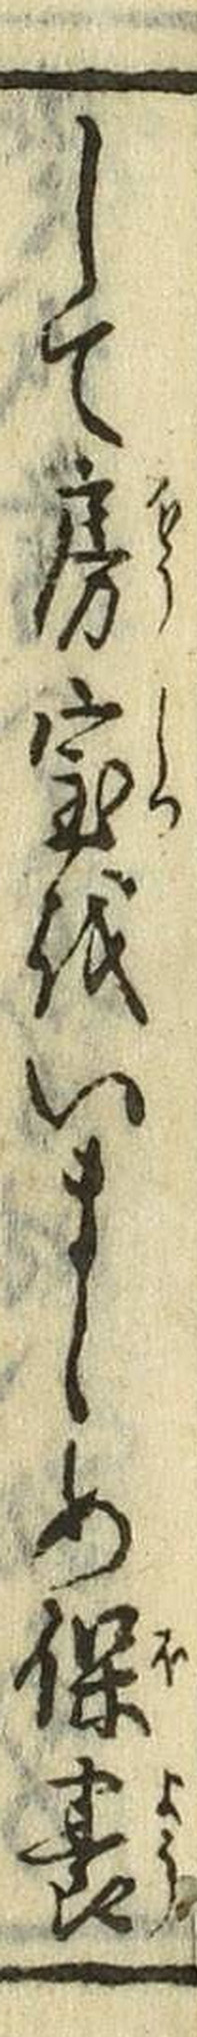して房室をいましめ保養
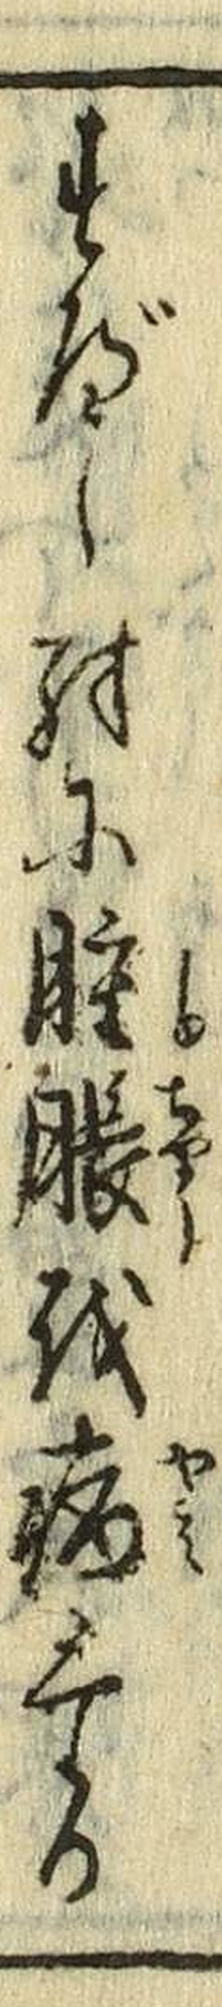すべし殊に腫脹を病たる
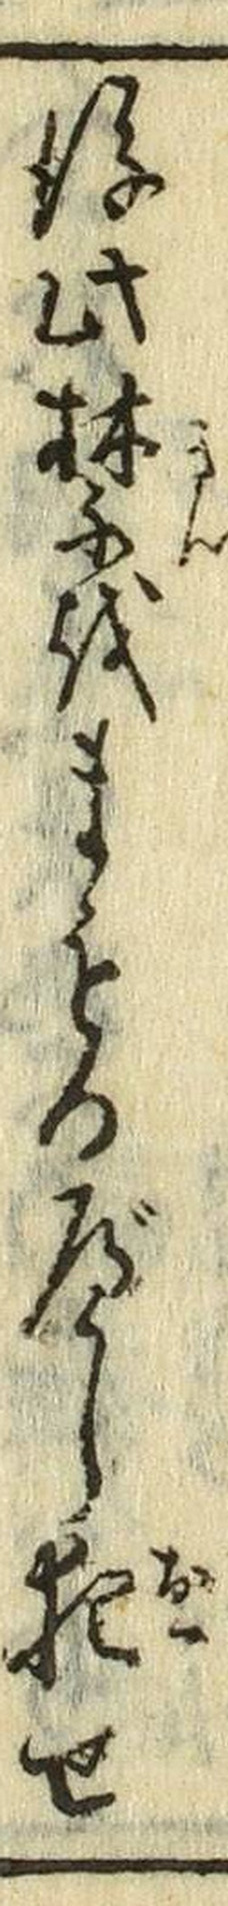後此禁をまもるべし犯せ
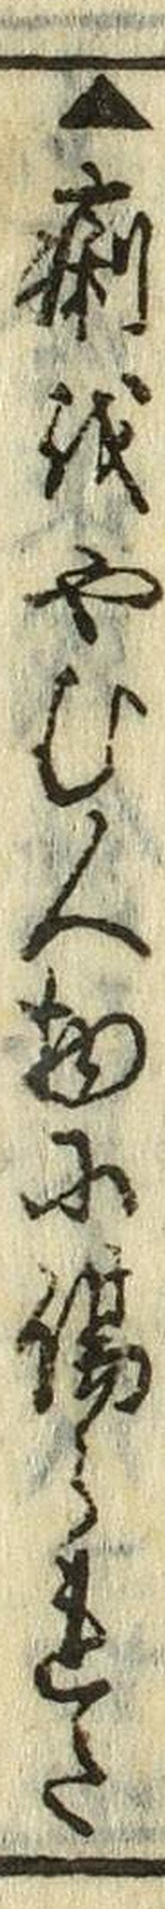▲痢をやむ人物に傷られた
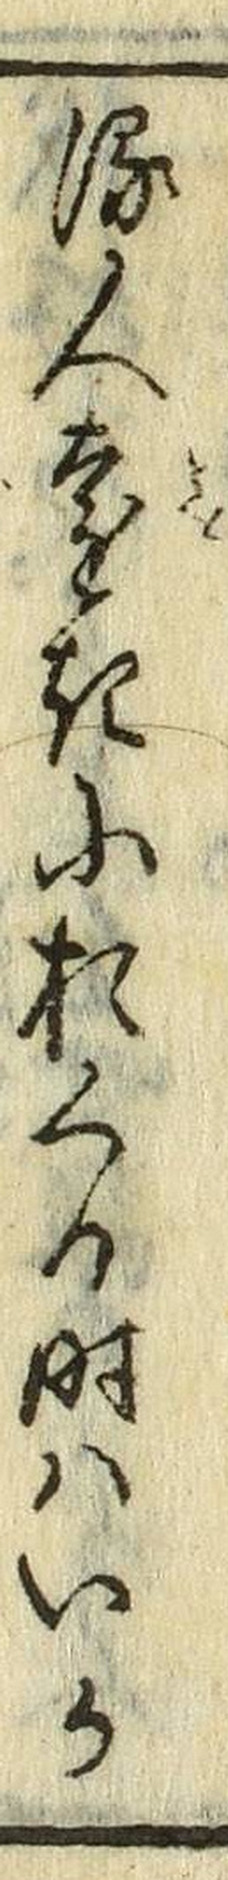る人遠きにおくる時はいか
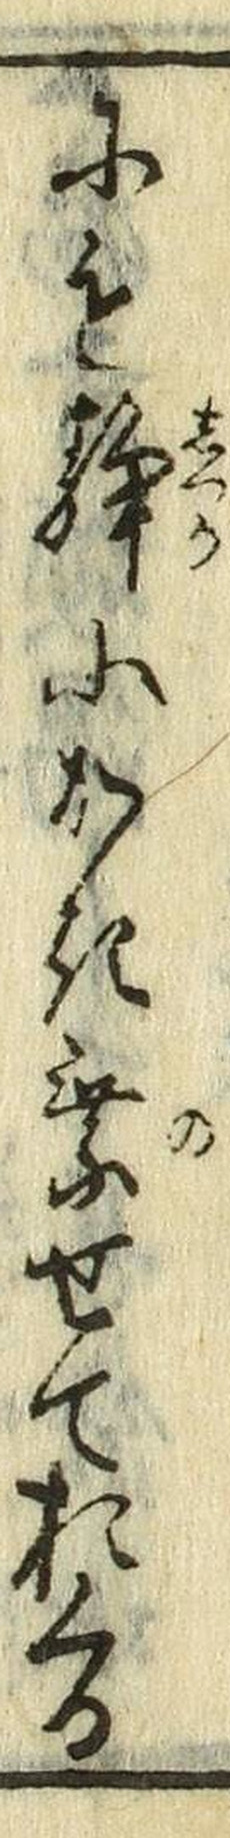にも静にかき乗せておくる
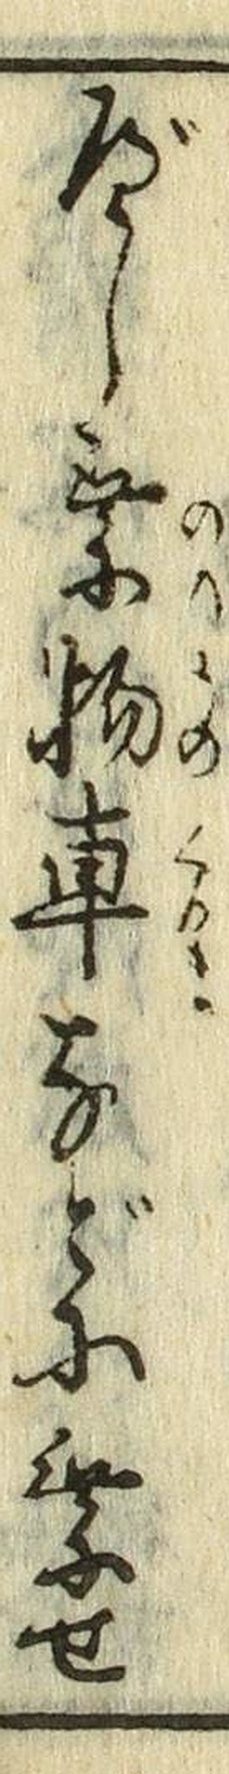べし乗物車などに乗せ
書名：居家養生記
